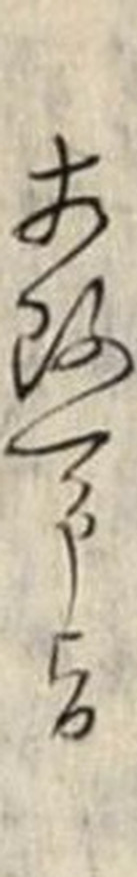相改可申旨
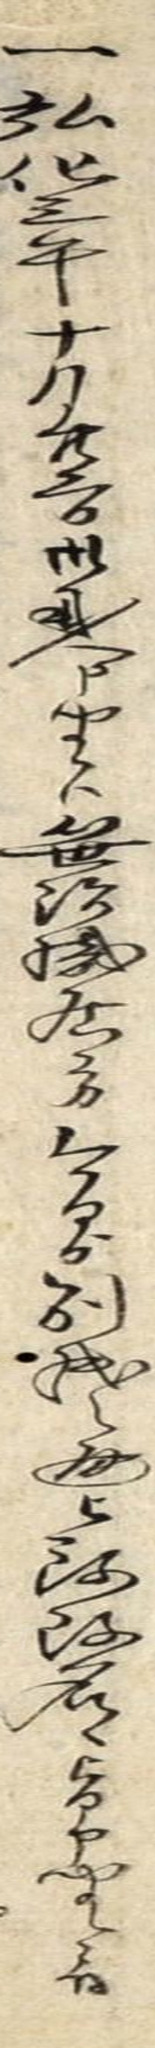一弘化三午十月廿二日御用人申聞候は笹治織居方今日ゟ別紙之通被致改名候旨申聞候に付
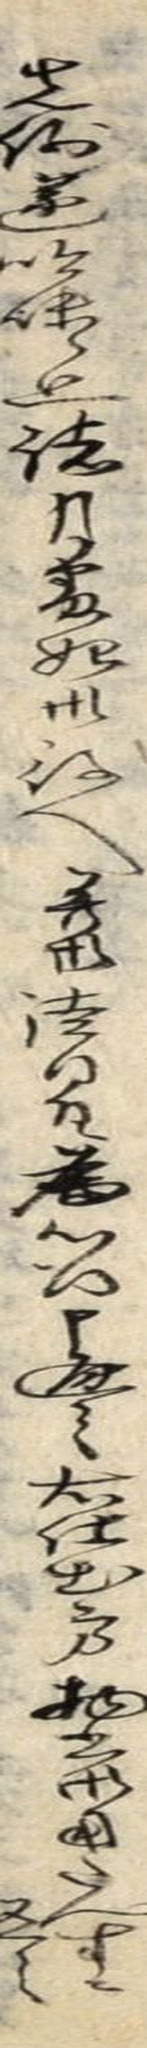先例遂吟味候上諸月番始御役人并御徒目付へ為心得申通之右仕出方物書御用御聞に有之
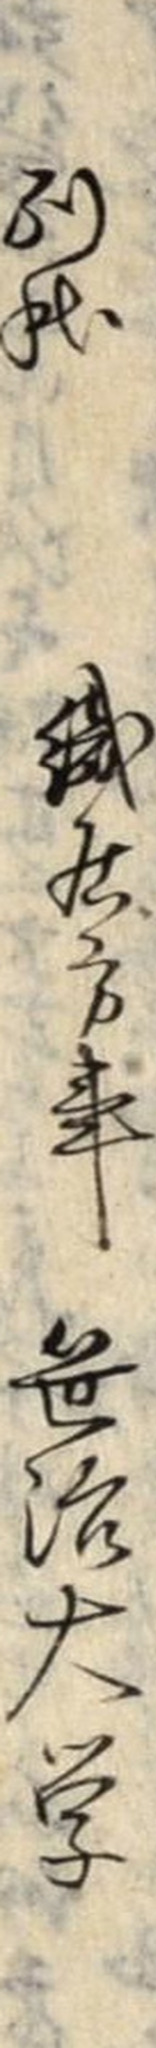別紙織居方事笹治大学
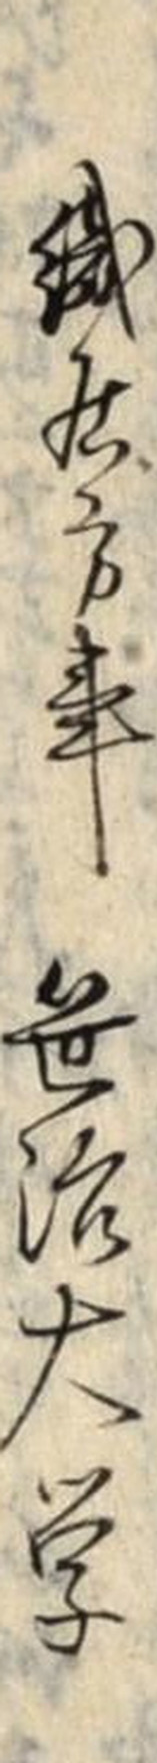別紙織居方事笹治大学

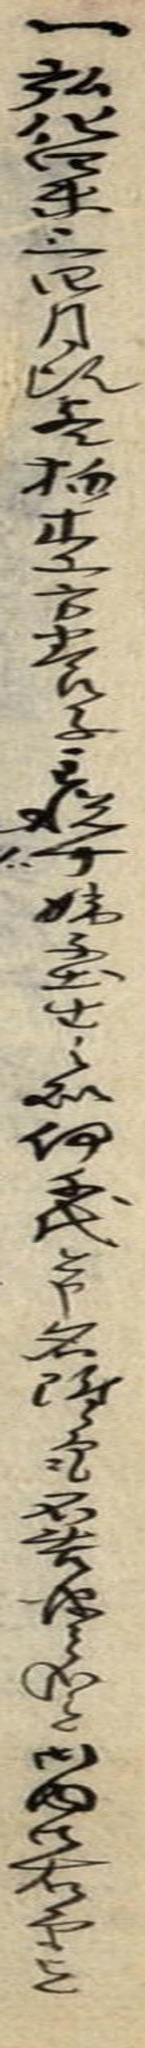一弘化四未三四月頃歟狛木工方養子主税介嫡子出生之処何千代と申名附候而も不苦儀候哉と御内御右筆迄
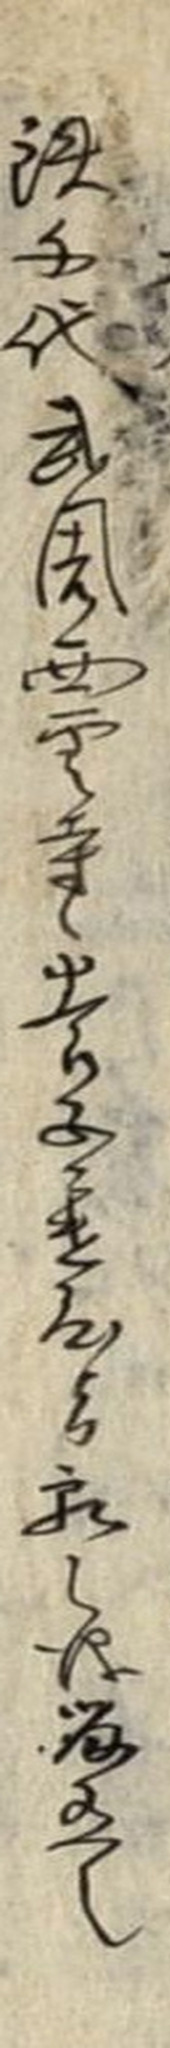鉄千代武周西雲寺へ養子に遣度旨願之儀留有之
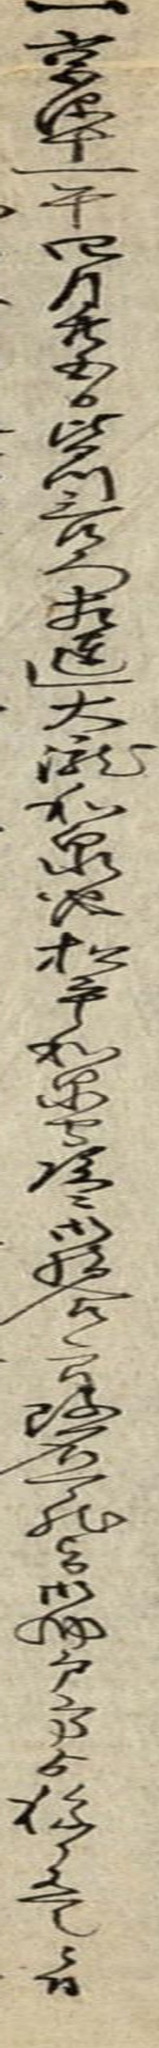一享保十一午四月廿五日皆川三左衛門相達」大瀧和泉儀松平和泉守殿に御指合候間改名可然旨御納戸方ゟ移り有之候に付
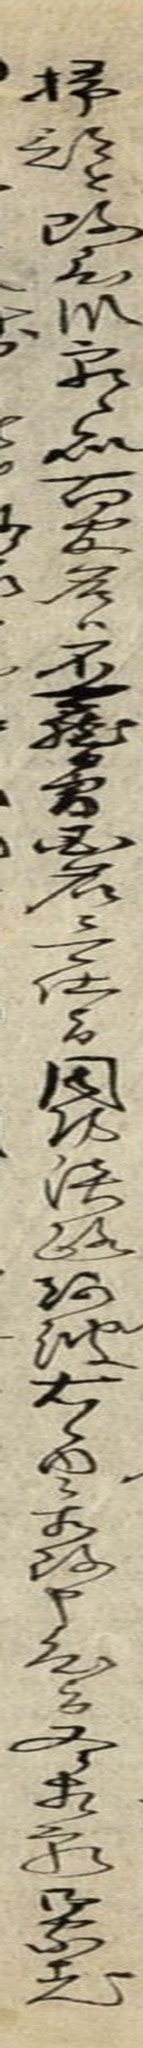掃部と改度段願候処百官名は不可然候間国名に可仕旨周防讃岐阿波右之内に相改申度旨又々相願御家老
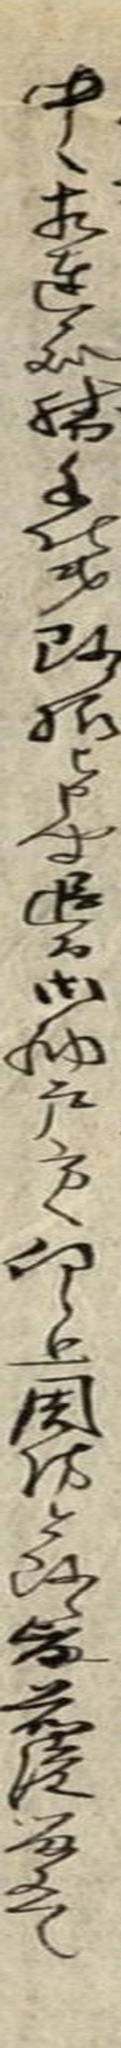中へ相達候処勝手次第改候様被申聞追而御納戸方へ伺之上周防と改候旨前後留有之
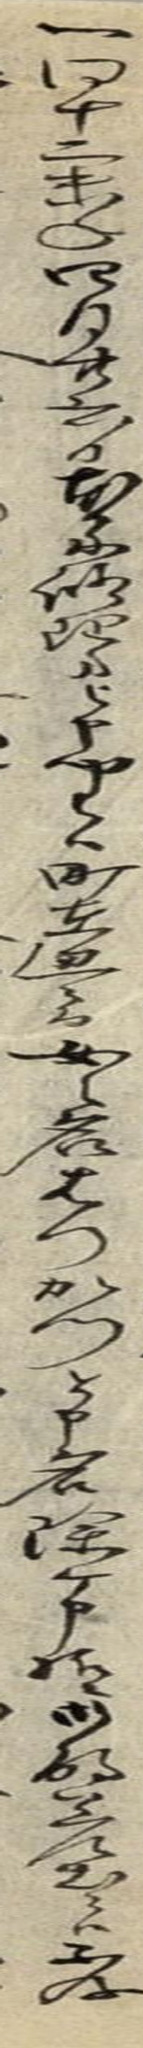一同十二未年四月廿六日本多修理方被申聞候は町在辺に而女之名はつかつと申名除ヶ申様に御触差出には不及
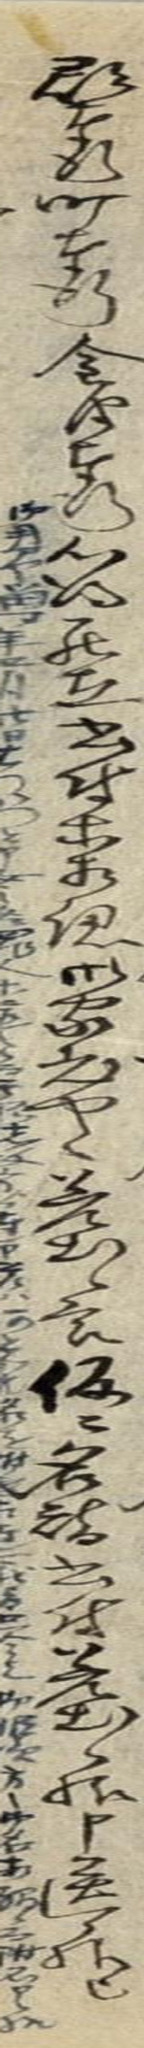郡奉行町奉行金津奉行心得罷在書付等相認御家老中へ差出候節仮に名替書付差出候様申送候様被
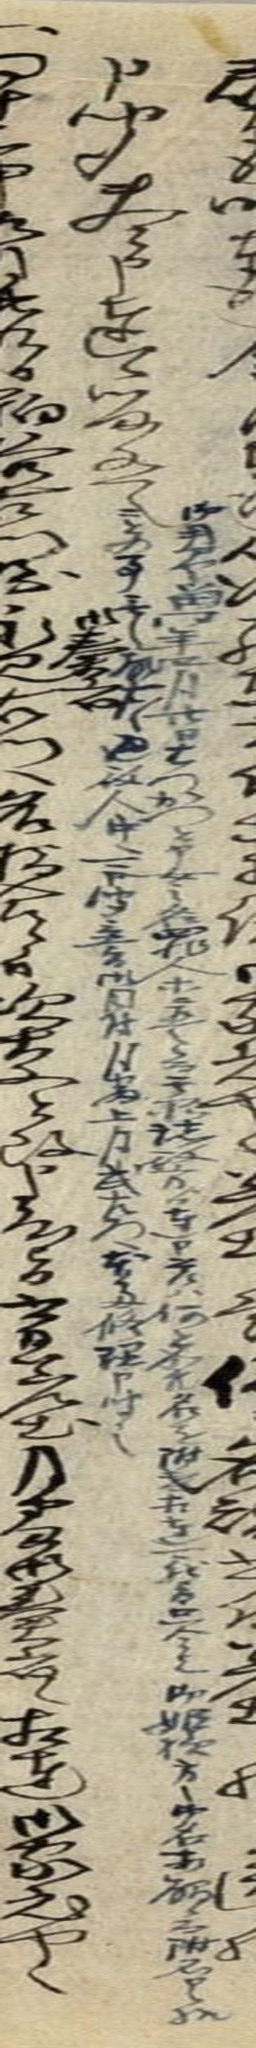一同十三申九月廿九日粕谷右門儀御奏者永見右門へ名指合候に付次太夫と改申度旨書付差出月番御奏者へ相達御家老中へ
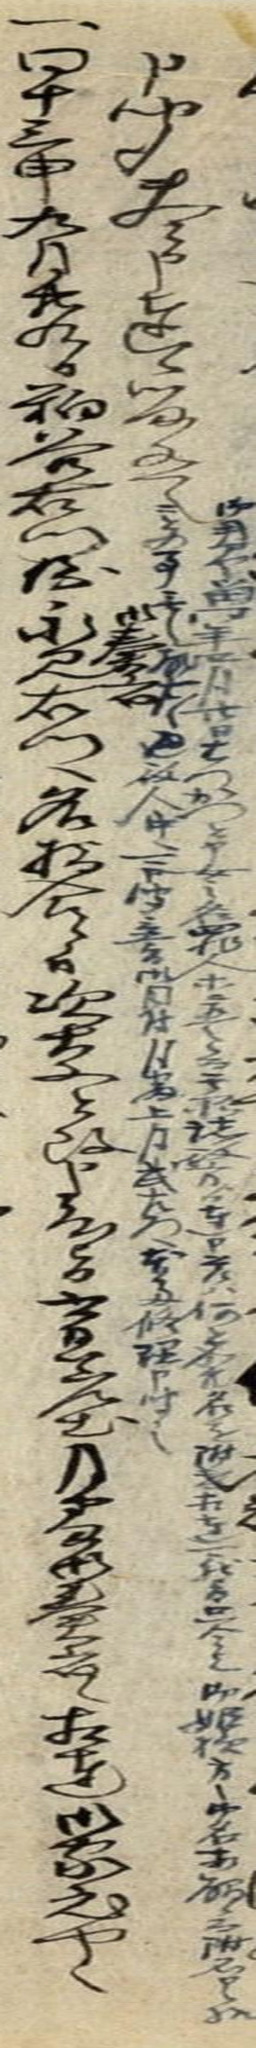一同十三申九月廿九日粕谷右門儀御奏者永見右門へ名指合候に付次太夫と改申度旨書付差出月番御奏者へ相達御家老中へ
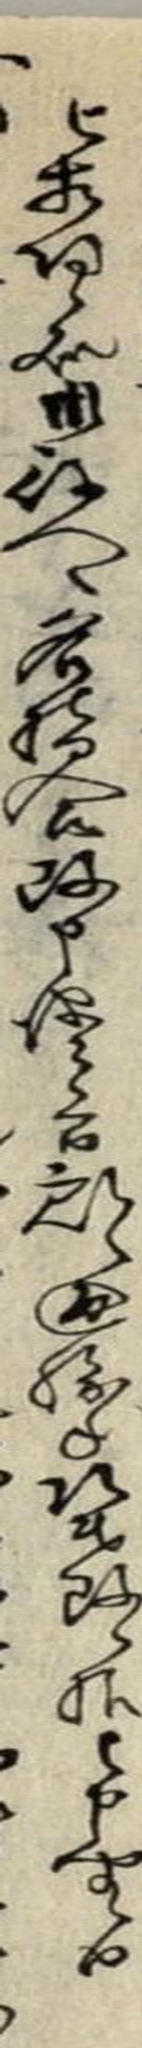被相伺候処御役人へ名指合改申候儀に候間願之通勝手次第改候様被申聞候由
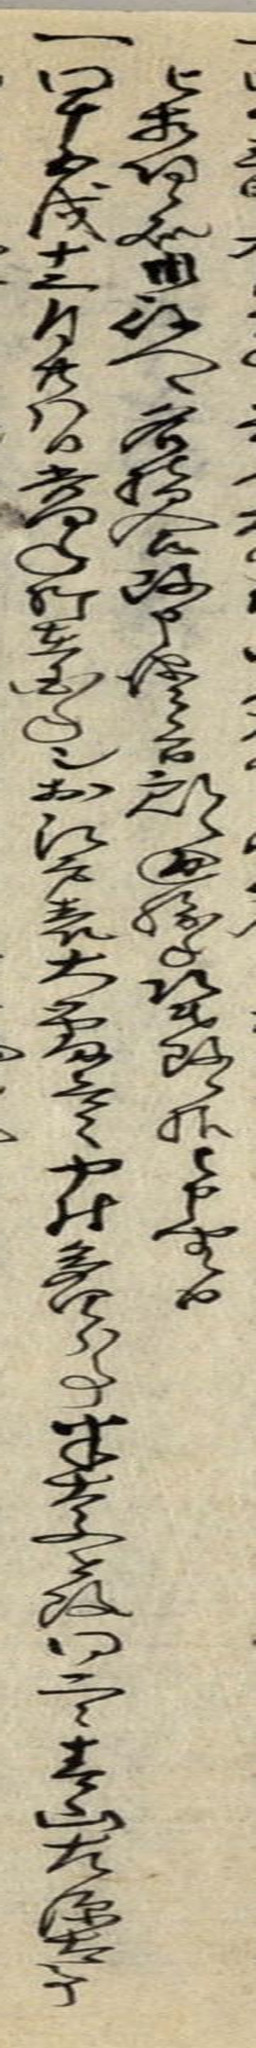一同十五戌十二月廿八日当年御在国年也於江戸表大御番壱之中村多四郎事半太夫と改同二之青山左源太事
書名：蒐輯之部
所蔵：福井県文書館 Fukui Prefectural Archives
